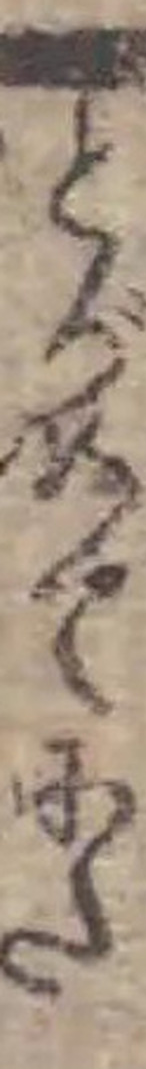とがめてにた
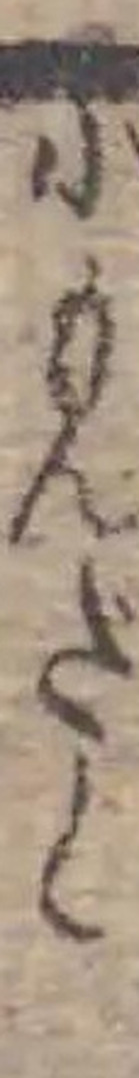小もんだと
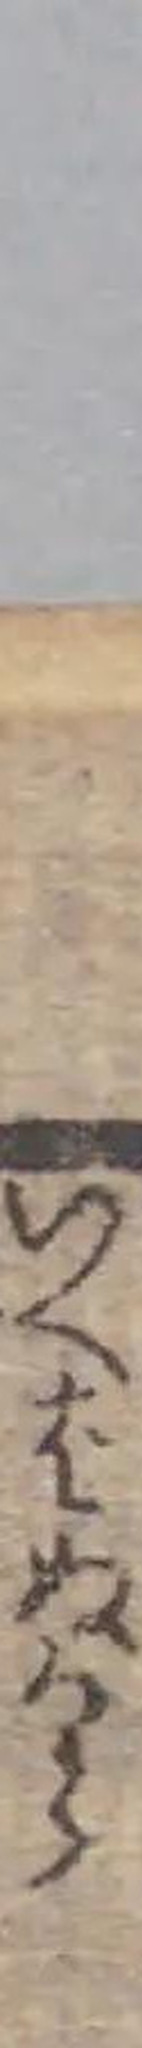いへはぬから
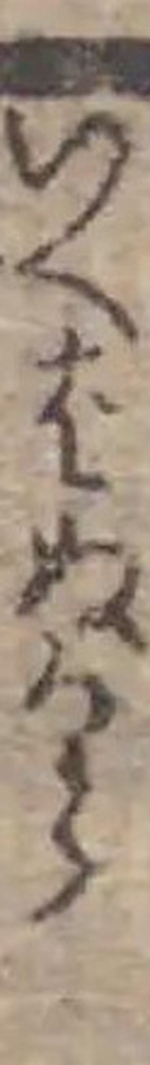いへはぬから
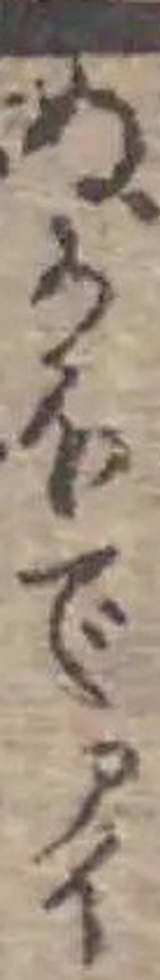ぬかほでアイ
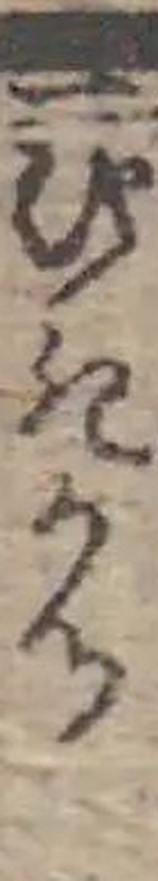一ぴきかつ
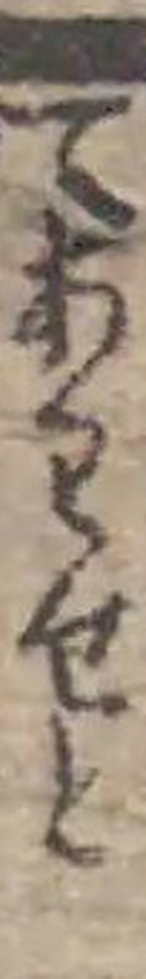てあわせと
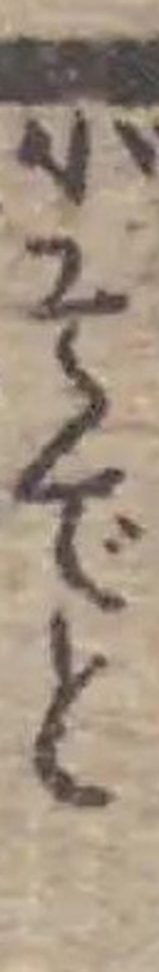小そでと
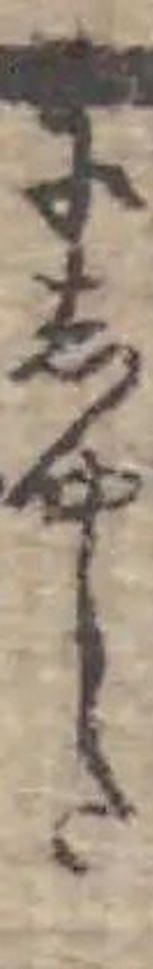にしやした
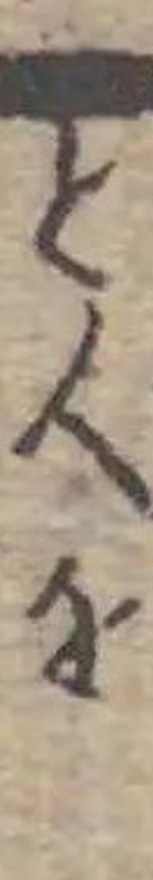と人を
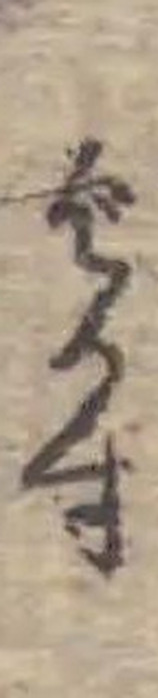ばかす
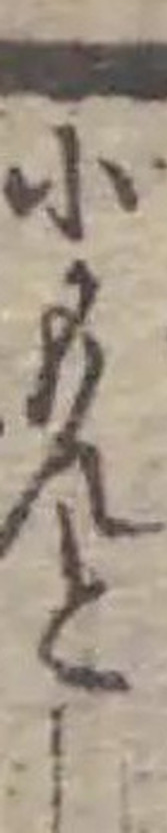小もんと
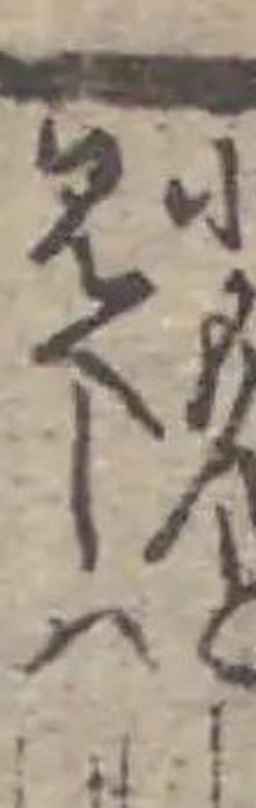見へしは
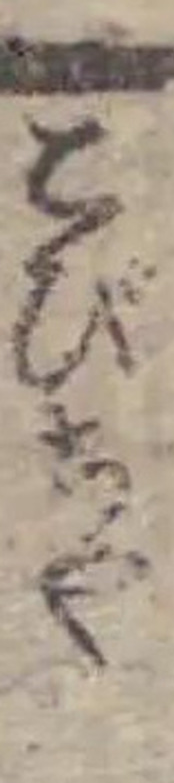こびちや
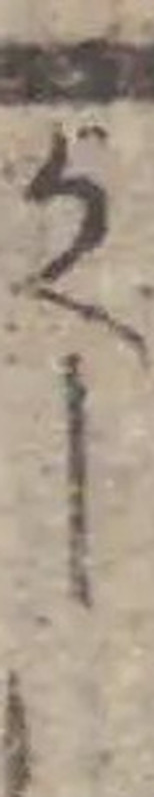がへし
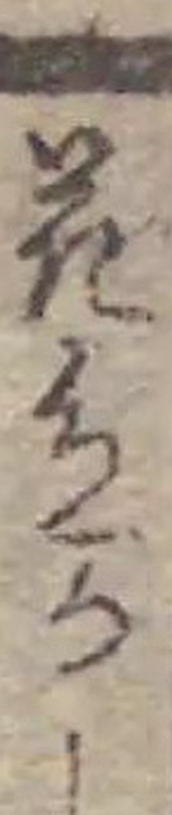花色か
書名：作意妖恐懼感心 2巻
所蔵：国立国会図書館 National Diet Library, JAPAN
